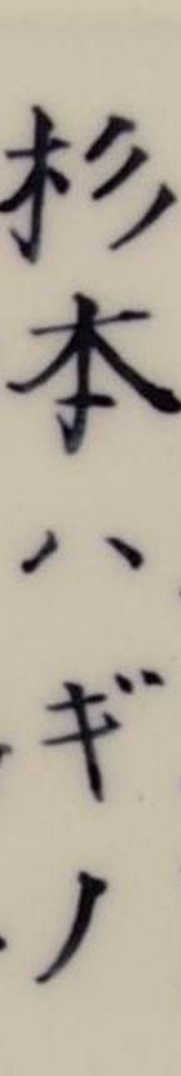杉本ハギノ
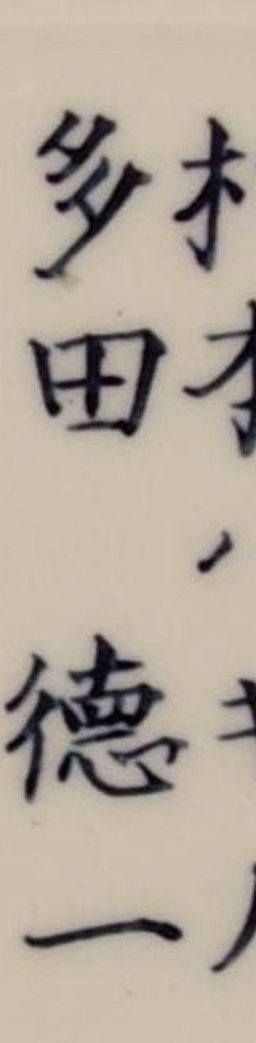多田徳一
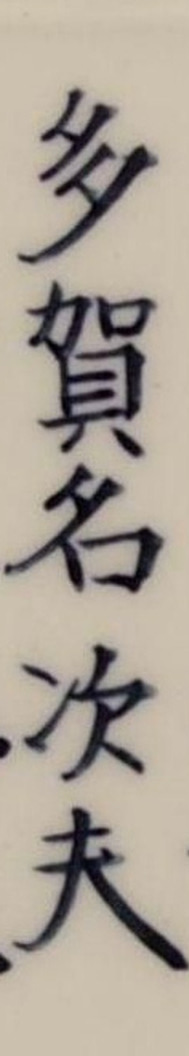多賀名次夫
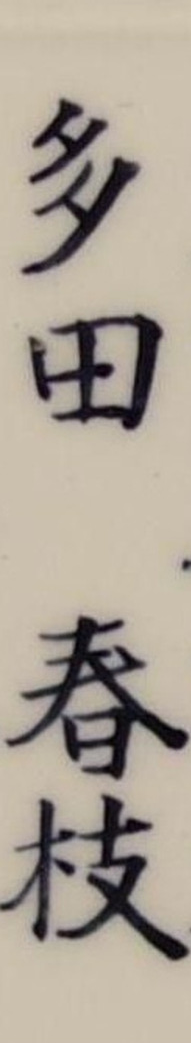多田春枝
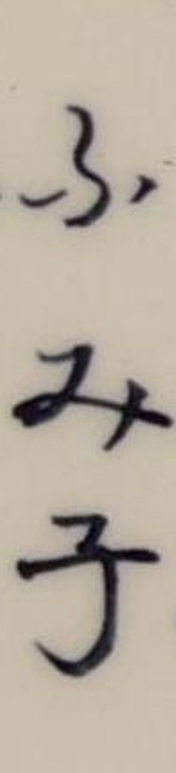ふみ子
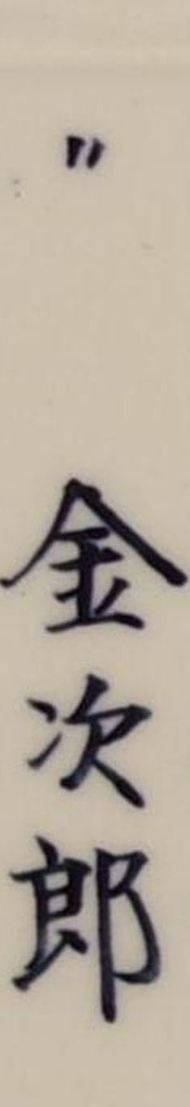金次郎
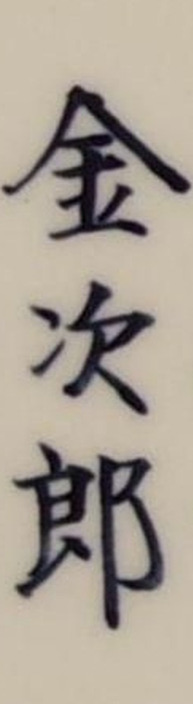金次郎
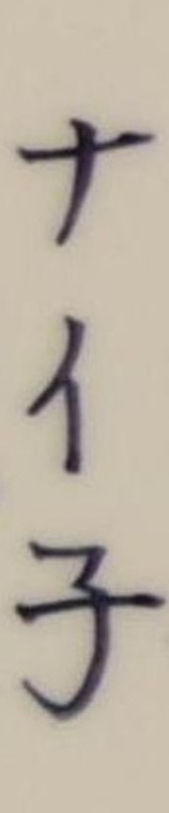ナイ子

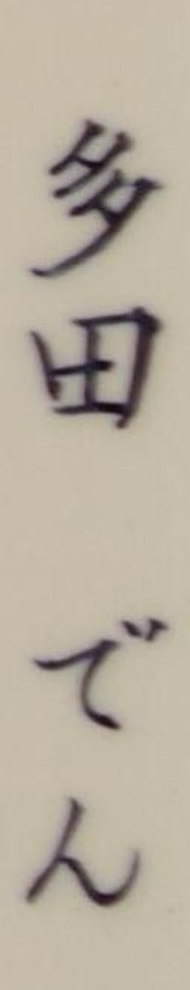多田でん
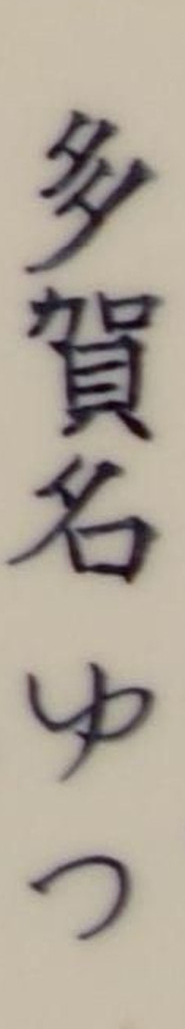多賀名ゆつ
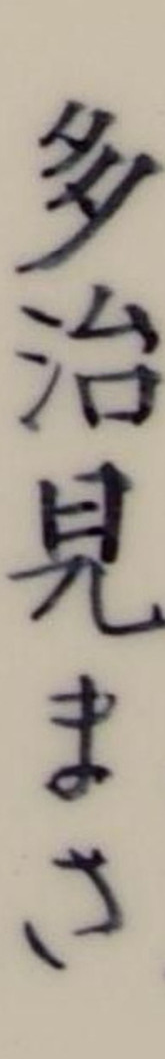多治見まさ
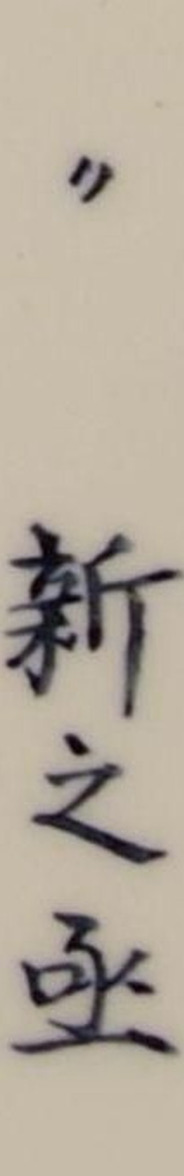新之丞
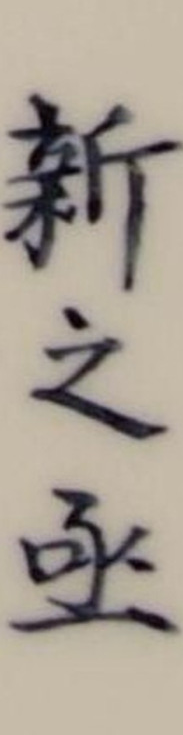新之丞
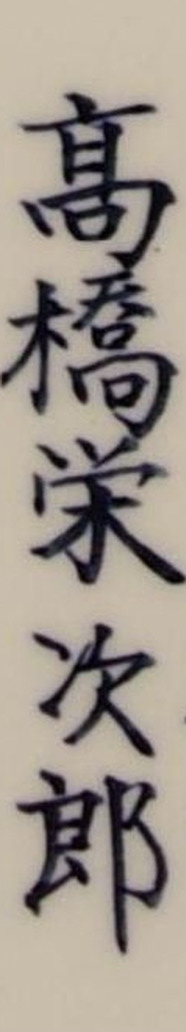高橋栄次郎
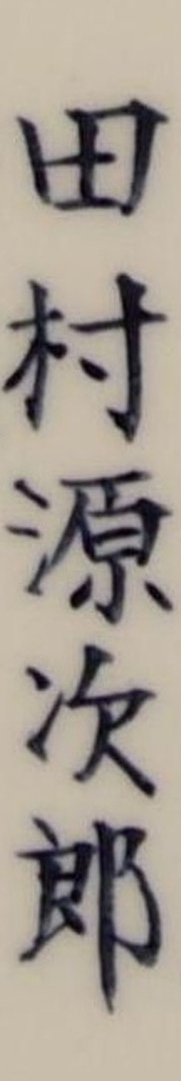田村源次郎
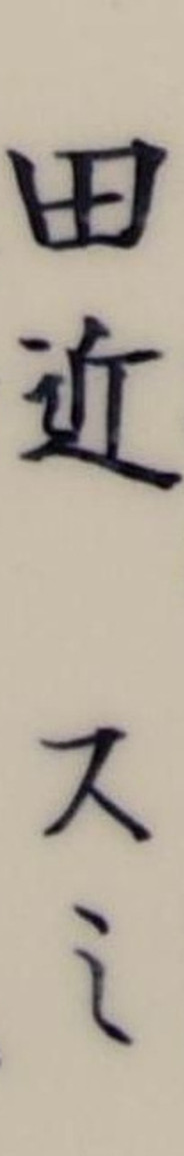田近スミ
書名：E~L
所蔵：高野山金剛峯寺
